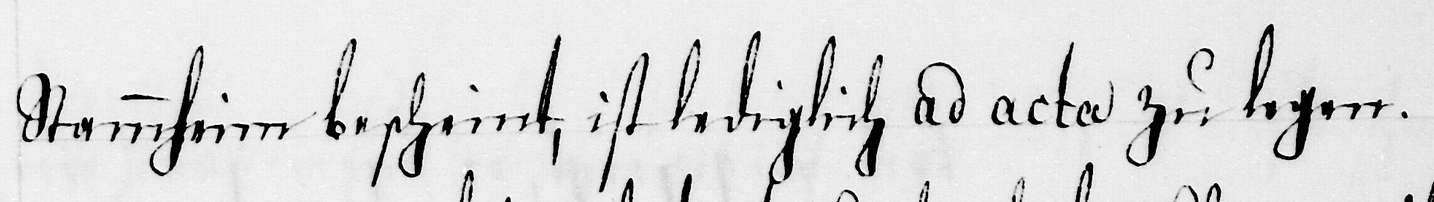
Stammheim bescheint, ist lediglich ad acta zu legen.
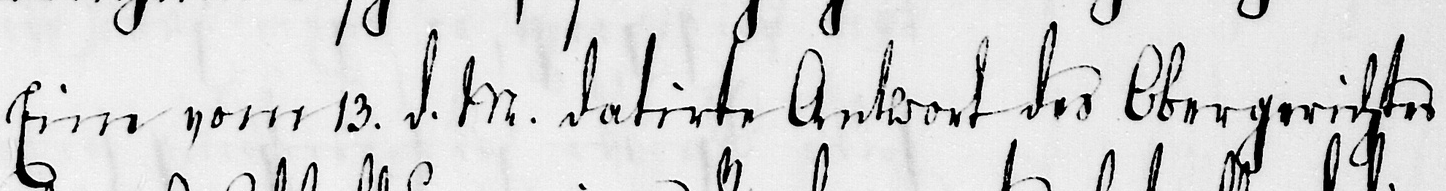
Eine vom 13. d. M. datirte Antwort des Obergerichtes
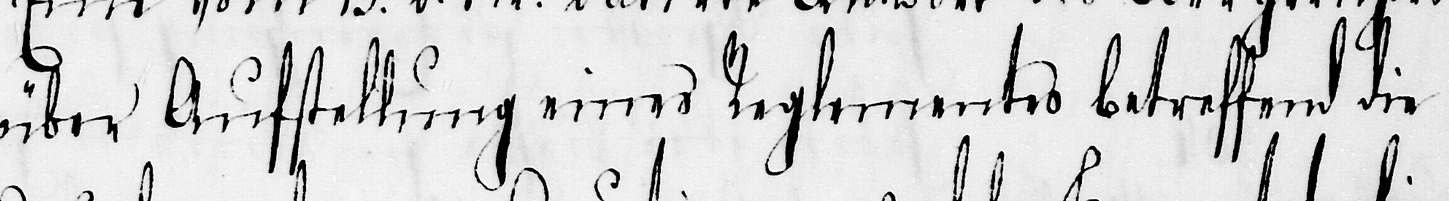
über Aufstellung eines Reglementes betreffend die
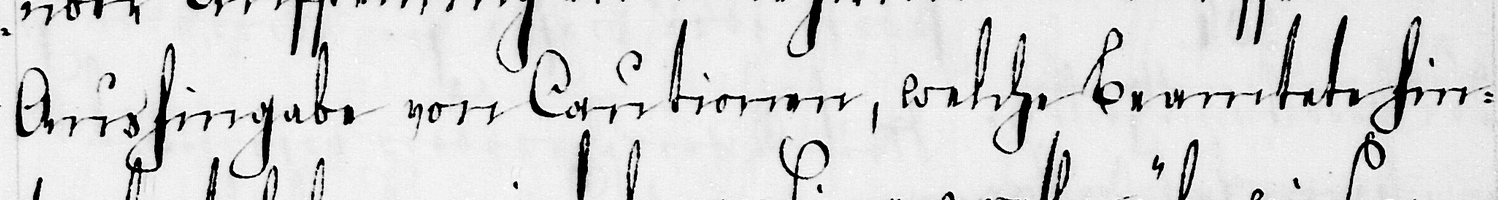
Aushingabe von Cautionen, welche Beamtete hin¬
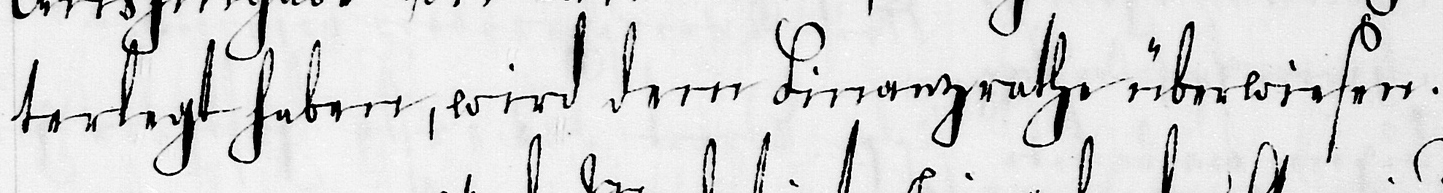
terlegt haben, wird dem Finanzrathe überwiesen.
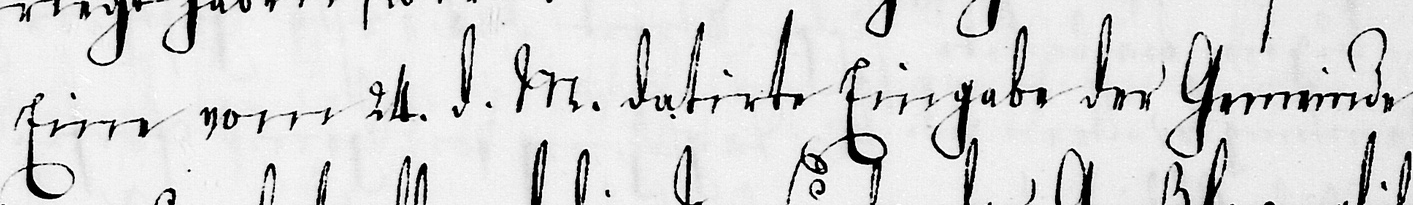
Eine vom 24. d. M. datirte Eingabe der Gemeinde
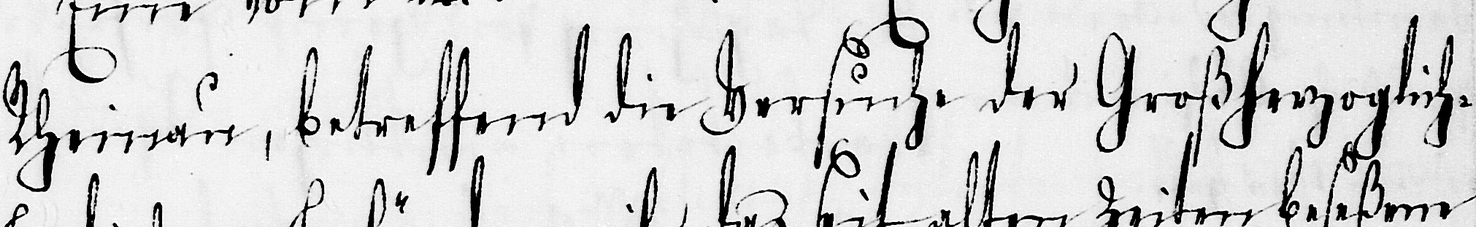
Rheinau, betreffend die Versuche der Großherzoglic¬
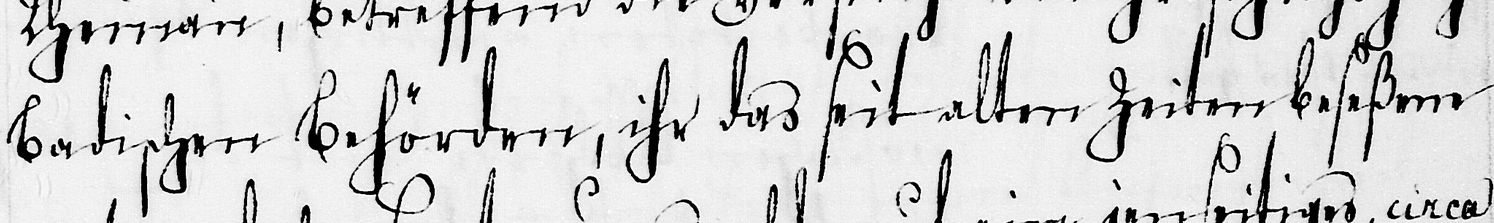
adischen Behörden, ihr das seit alten Zeiten beseßene
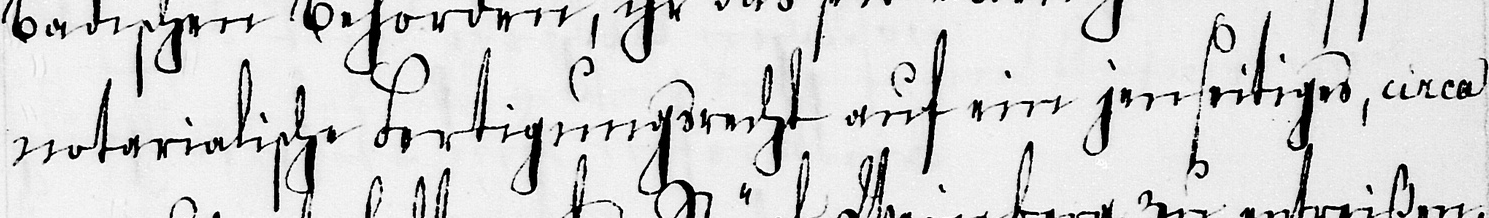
notarialische Fertigungsrecht auf ein jenseitiges, circa
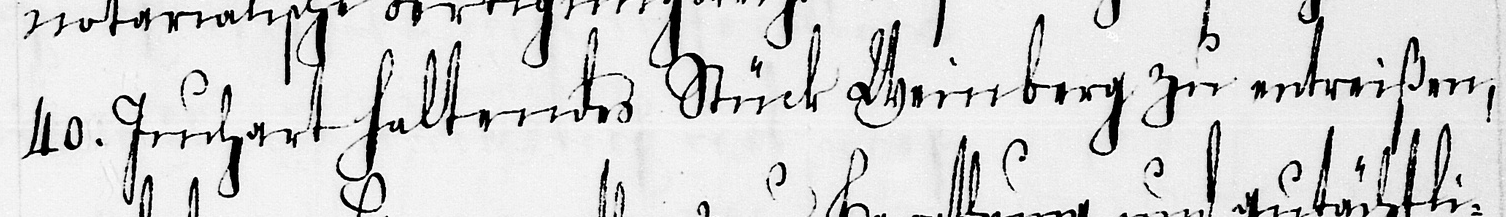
40. Juchart haltendes Stück Weinberg zu entreißen,
